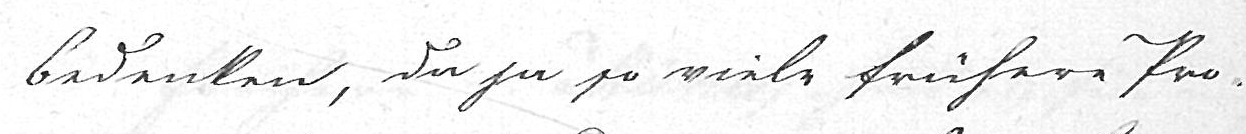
bedenken, da ja so viele frühere Pro-
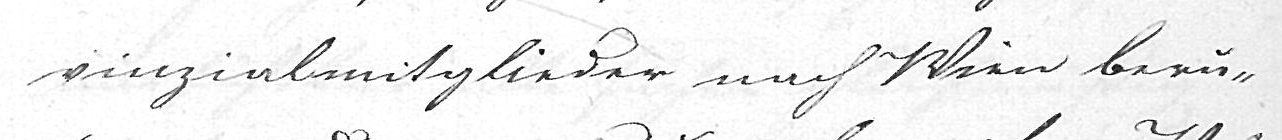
vinzialmitglieder nach Wien beru-
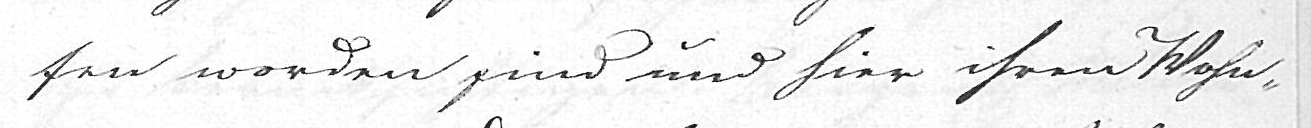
fen worden sind und hier ihren Wohn-
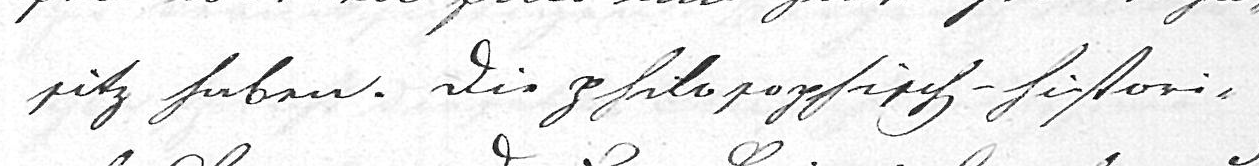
sitz haben. Die philosophisch-histori-
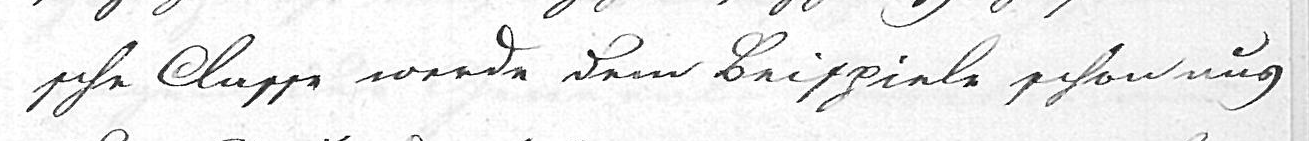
sche Classe werde dem Beispiele schon aus
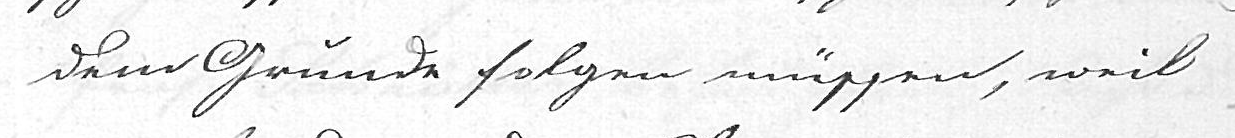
dem Grunde folgen müssen, weil
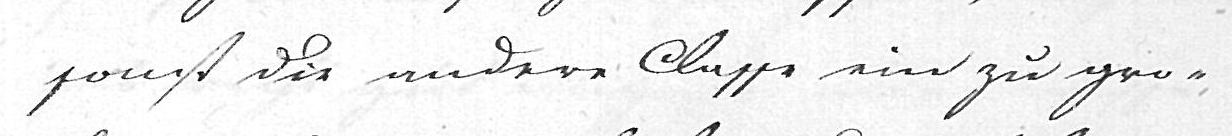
sonst die andere Classe ein zu gro-
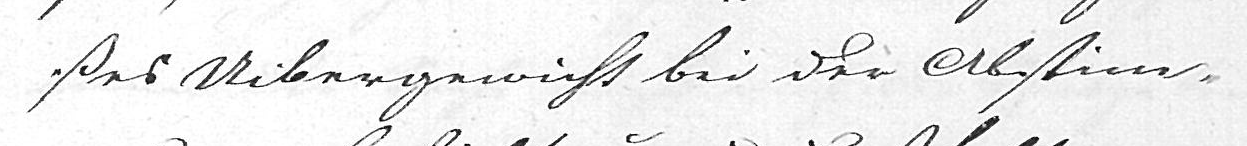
ßes Uibergewicht bei der Abstim-
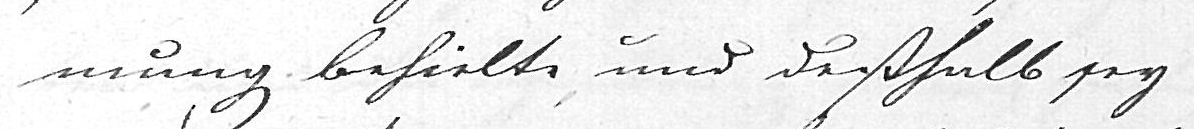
mung behielte und deßhalb sey
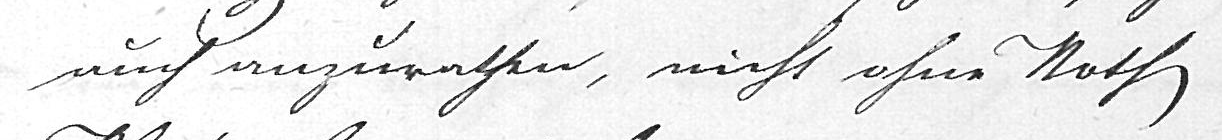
auch anzurathen, nicht ohne Noth
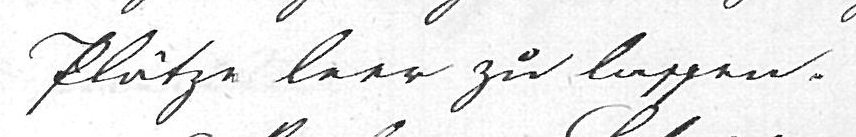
Plätze leer zu lassen.
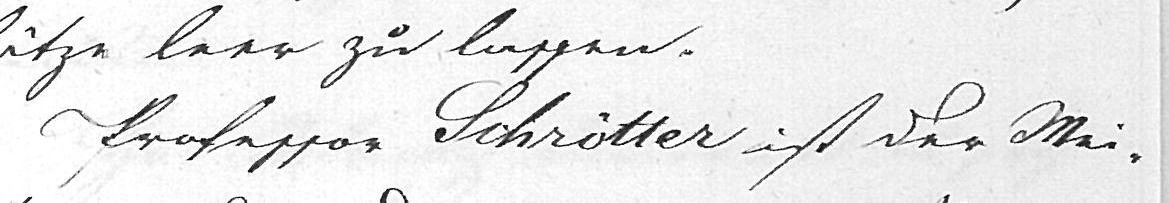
Professor Schrötter ist der Mei-
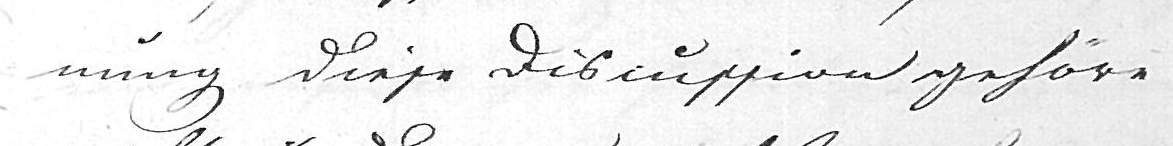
nung diese Discussion gehöre
